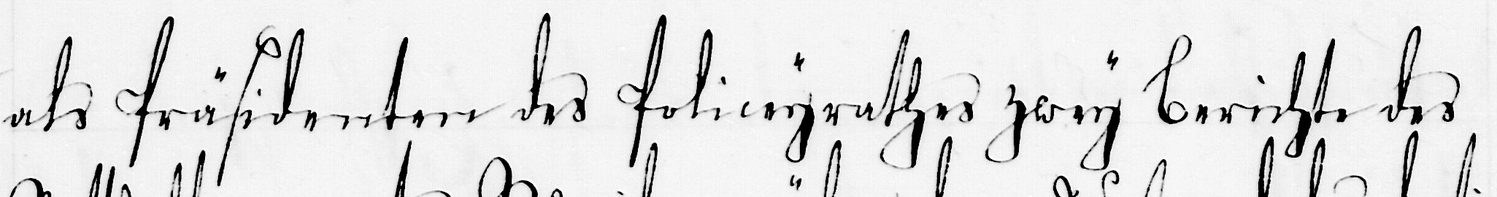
als Präsidenten des Policeyrathes zwey Berichte des
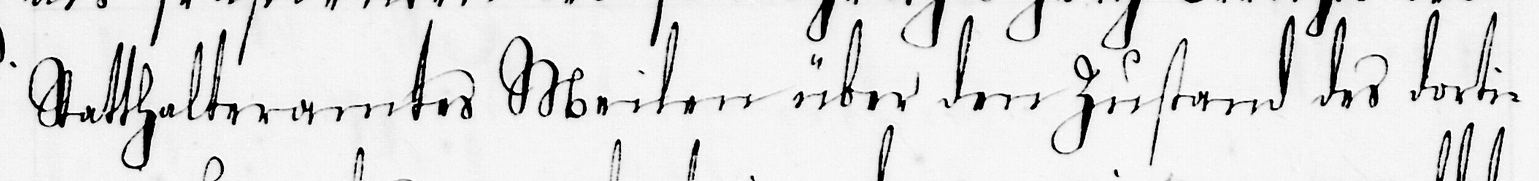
Statthalteramtes Meilen über den Zustand des dorti¬
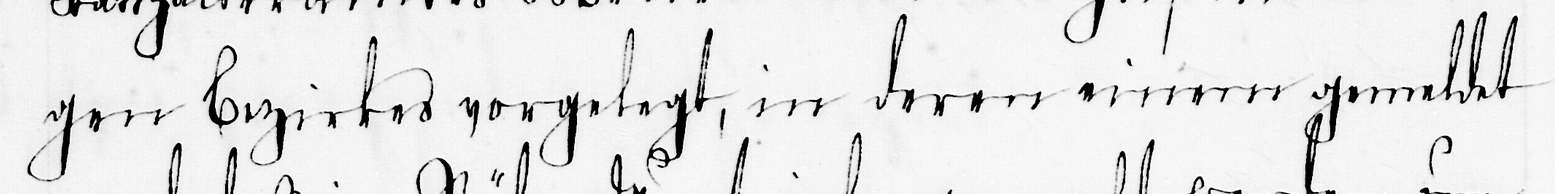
gen Bezirkes vorgelegt, in deren einem gemeldet
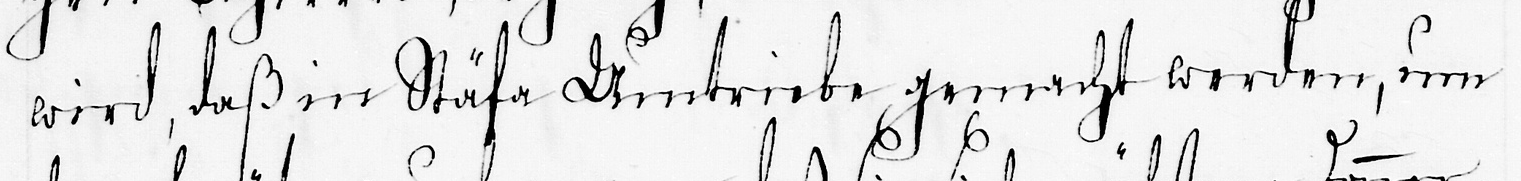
wird, daß in Stäfa Umtriebe gemacht werden, um
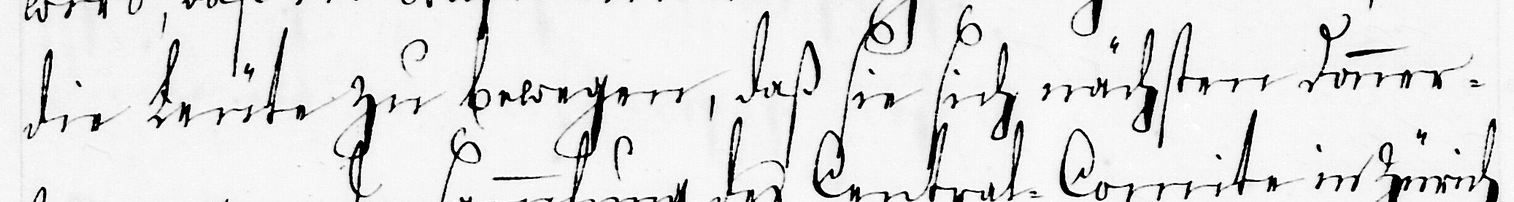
die Leute zu bewegen, daß sie sich nächsten Donner¬
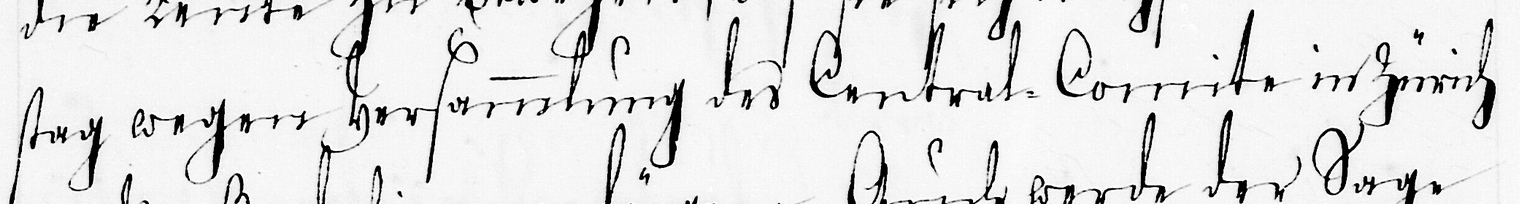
stag wegen Versammlung des Central-Comite in Zürich
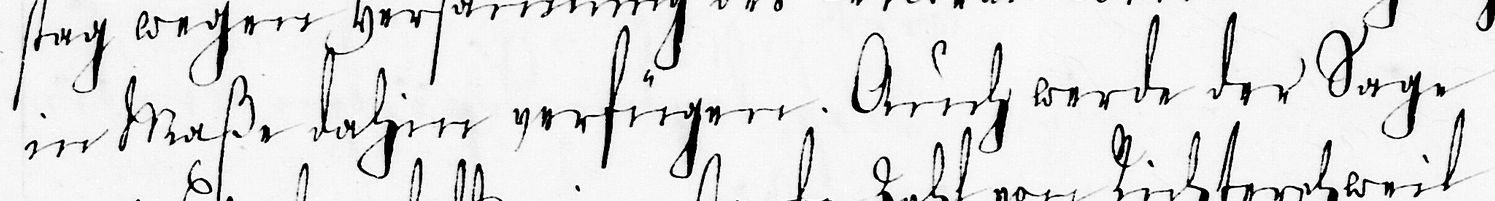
in Maße dahin verfügen. Auch werde der Sage
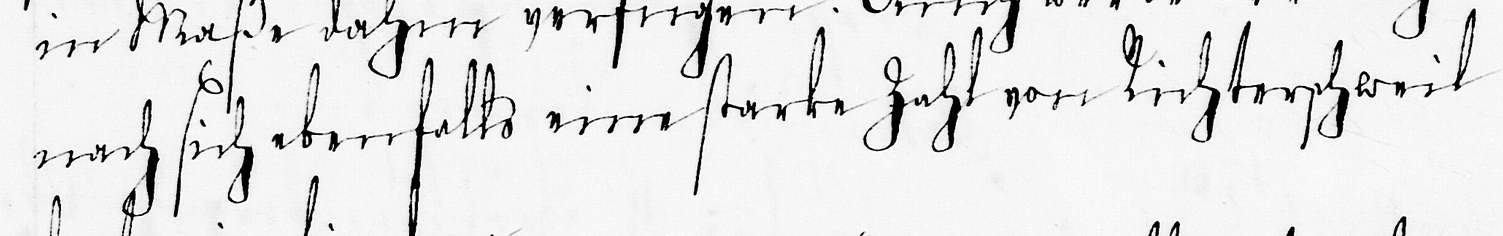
nach sich ebenfalls eine starke Zahl von Richterschweil
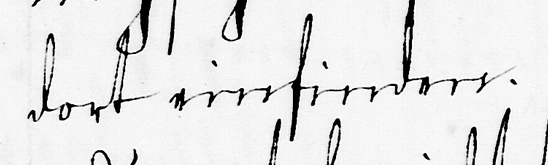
dort einfinden.
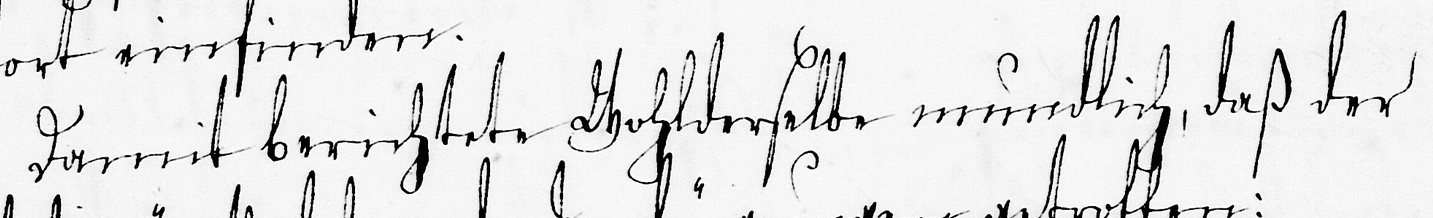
Damit berichtete Wohlderselbe mündlich, daß der
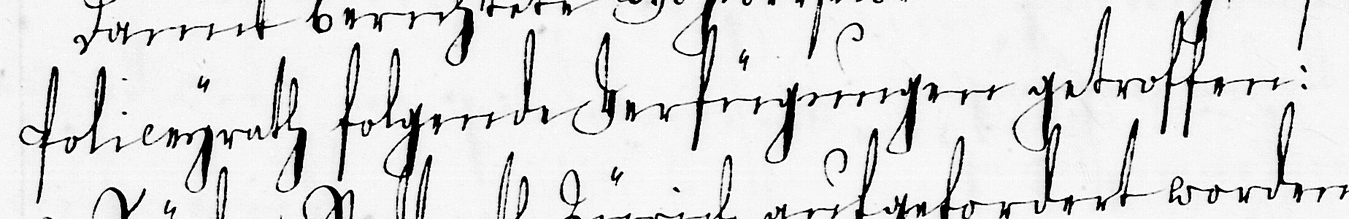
Policeyrath folgende Verfügungen getroffen:
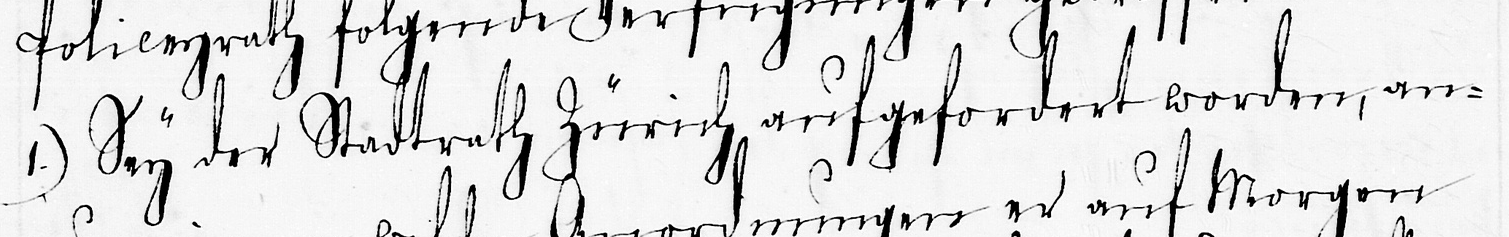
1.) Sey der Stadtrath Zürich aufgefordert worden, an¬
